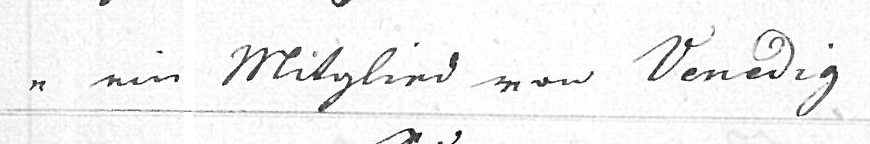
" ein Mitglied von Venedig
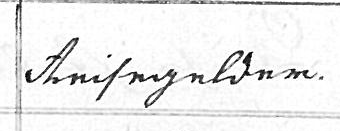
Reisegelder
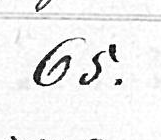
65.
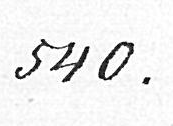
540.
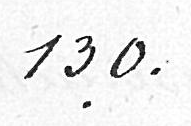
130.
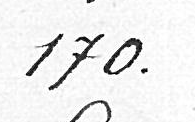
170.
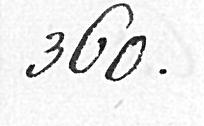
360.
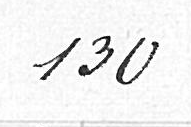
130
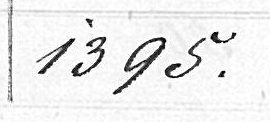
1395.
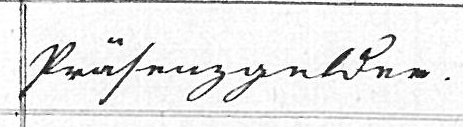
Präsenzgelder
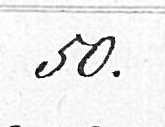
50.
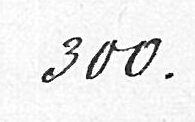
300.
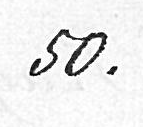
50.
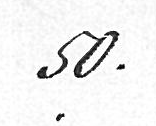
50.
